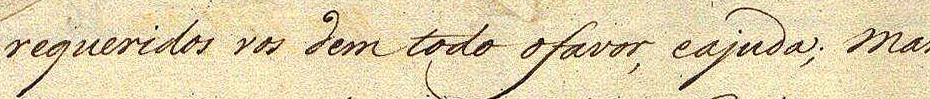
requeridos vos dem todo o favor, e ajuda; ma
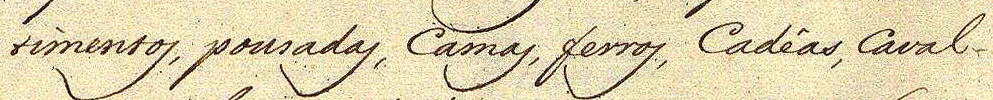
timentos, pousadas, Camas, ferros, Cadêas, Caval
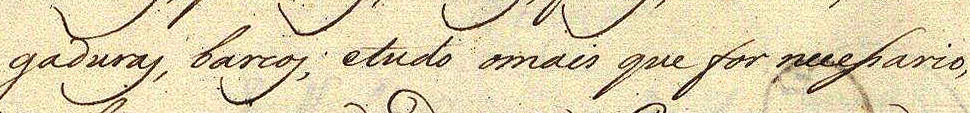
gaduras, barcos; e tudo o mais que for necessario,
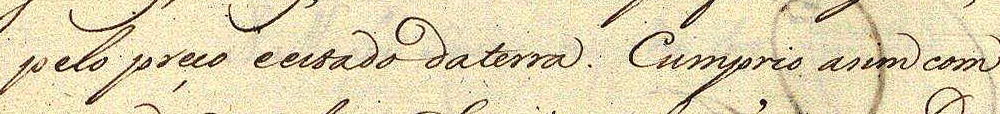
pelo preço e estado da terra. Cumprio asim com
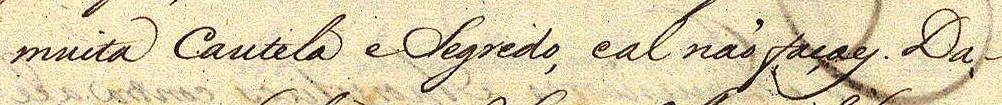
muita Cautela e Segredo, e al naõ façaes. Da
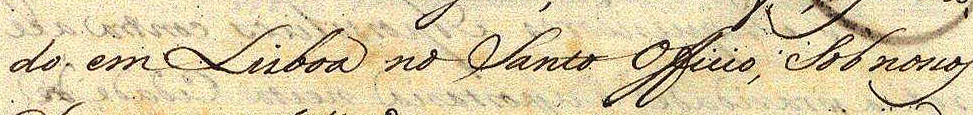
do, em Lisboa no Santo Officio; Sob nossos
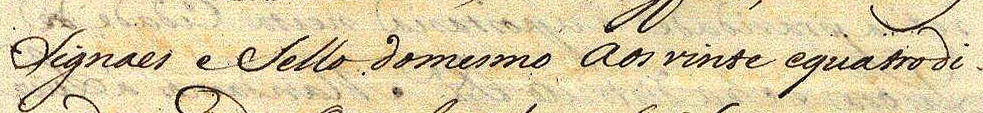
Signaes, e Sello do mesmo aos vinte e quatro di
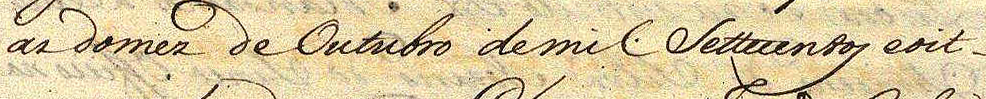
as do mez de Outubro de mil Settecentos e oit
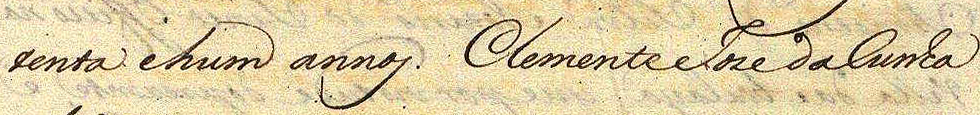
tenta e hum annos. Clemente Ioze da Cunha
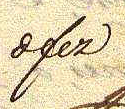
o fez
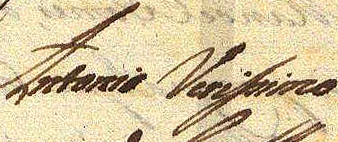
Antonio Verissimo
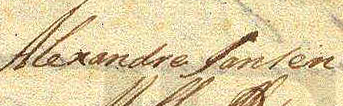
Alexandre Iansen
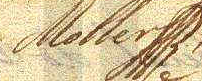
Moller
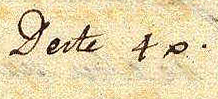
Deste 40.
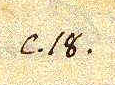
C.18.
